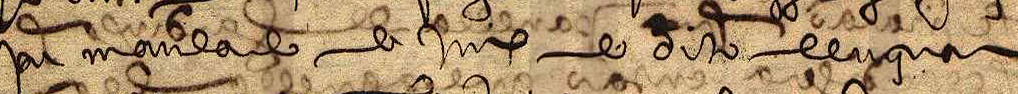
por mandado do Juis do dito lluguar
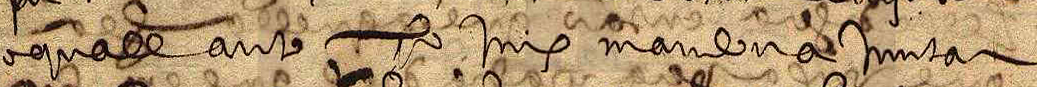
o quall auto ho Juis mandou aJuntar
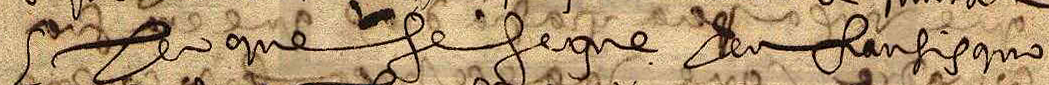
E he o que se segue e eu fransisquo
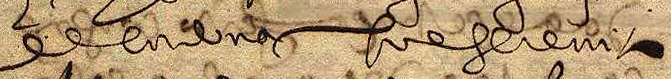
de cordoua ho escreui /
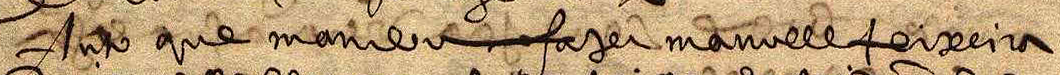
Auto que mandou fazer manoell teixeira
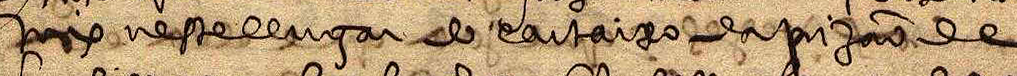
rois neste llugar do cartaixo da prizaõ de
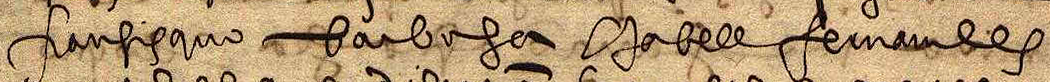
fransisquo barbosa E Jzabell fernamdes
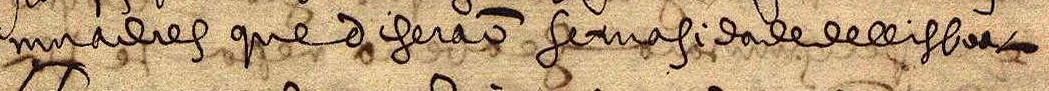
moradores que diseraõ ser na sidade de llisboa
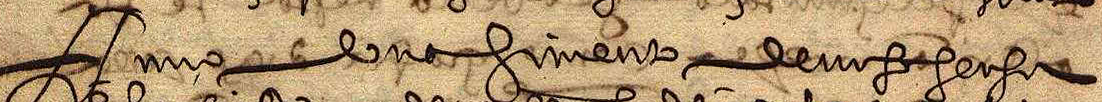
Anno do nasimento de noso senhor
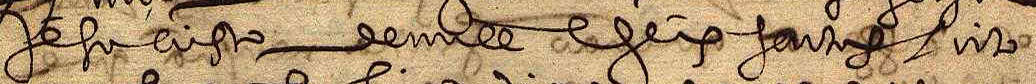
Jesu cristo de mill e seissentos e oito
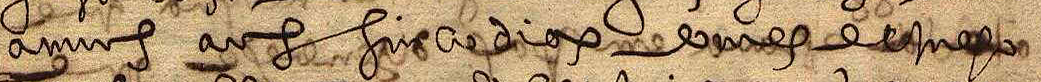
annos aos sinco dias do mes de Julho
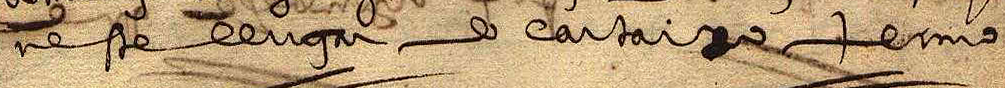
neste llugar do cartaixo termo
